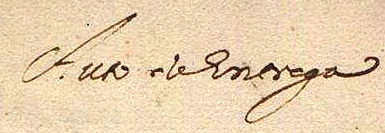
Auto de Entrega
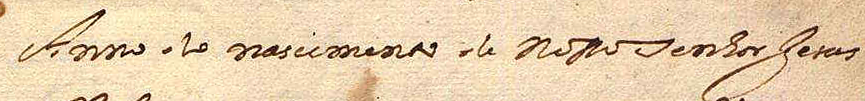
Anno do nascimento de nosso Senhor Jesus
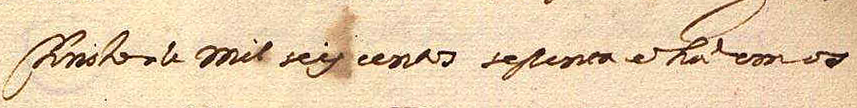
Christo de mil seiscentos sessenta e hū em os
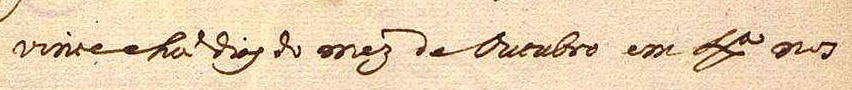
vinte e hū dias do mez de Outubro em Lxa nos
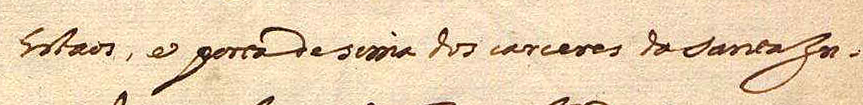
Estaos, e porta de sima dos carceres da Santa Jn
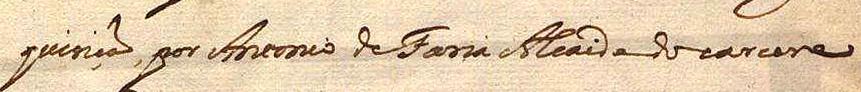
quisiçaõ, por Antonio de Faria Alcaide do carcere
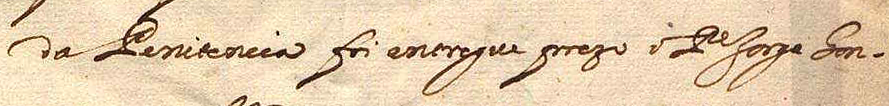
da Penitencia foi entregue prezo o Pe Jorge Gon
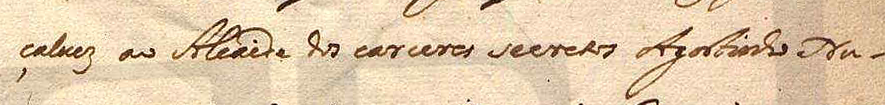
çaluez ao Alcaide dos carceres secretos Agostinho Nu
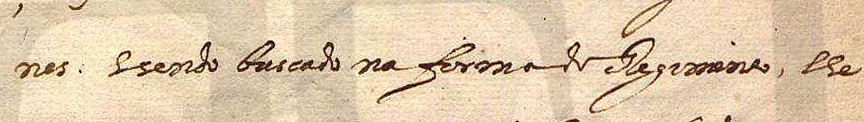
nes. E sendo buscado na forma do Regimento, lhe
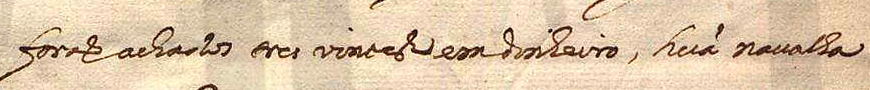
foraõ achados tres vintes̄ em dinheiro, huā naualha
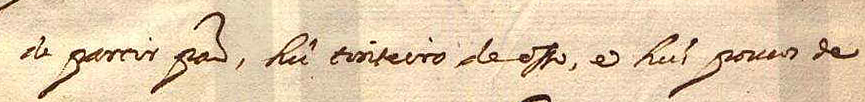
de partir paõ, hū tinteiro de osso, e hus̄ poucos de
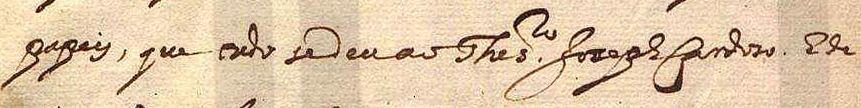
papeis, que tudo se deu ao Thes.ro Jozeph Cardoso. E de
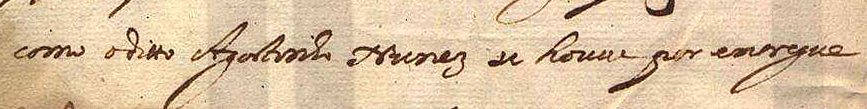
como o ditto Agostinho Nunez se houue por entregue
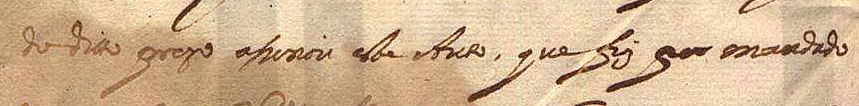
do ditto prezo assinou este Auto, que fiz por mandado
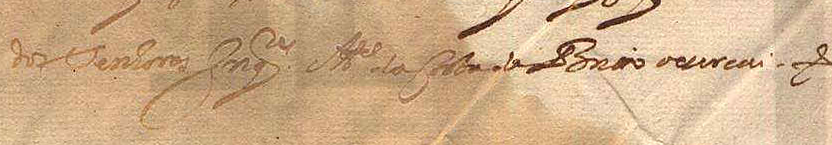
dos Senhores Jnq.res M.el da Costa de Britto o escreui
